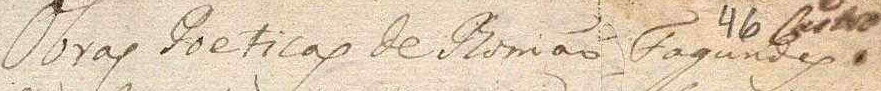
Obras Poeticas de Romaõ Fagundes o
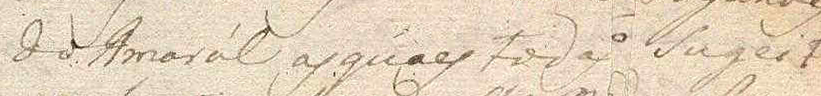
do Amarál, as quaes todas sugeita
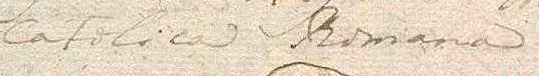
Catolica Romana
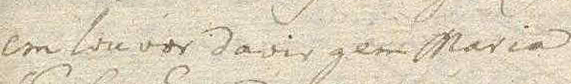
em louvor da virgem Maria
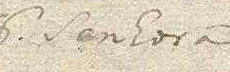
N.a Senhora
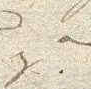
1.a
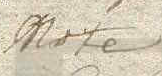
Mote
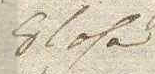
Glosa
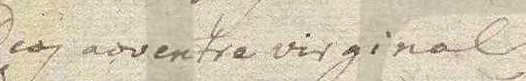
Deos ao ventre virginal
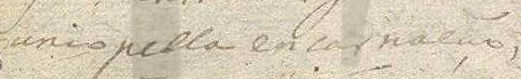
e unio pella encarnaçaõ,
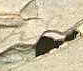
___
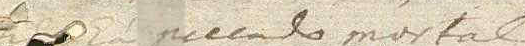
há peccado mortal
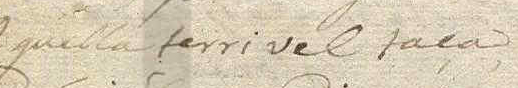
Aquella terrivel taça
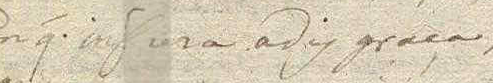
Em q̄ infuza a disgraça
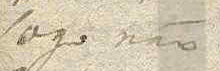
logo não
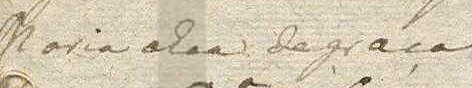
Maria chea de graça
